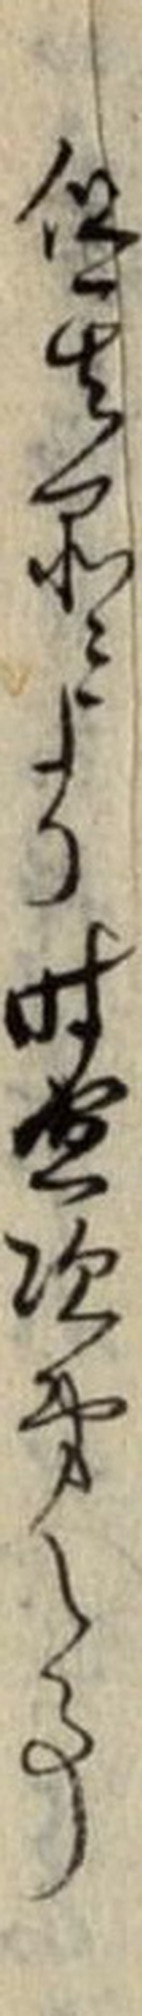但其品により時宜次第之事
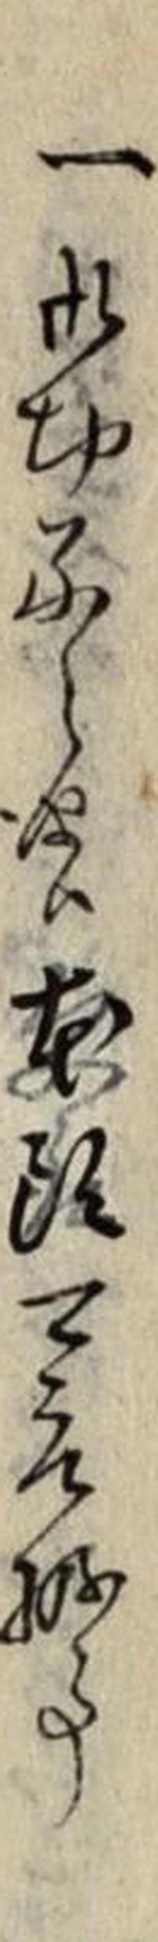一御切米之儀は本頭可取扱事
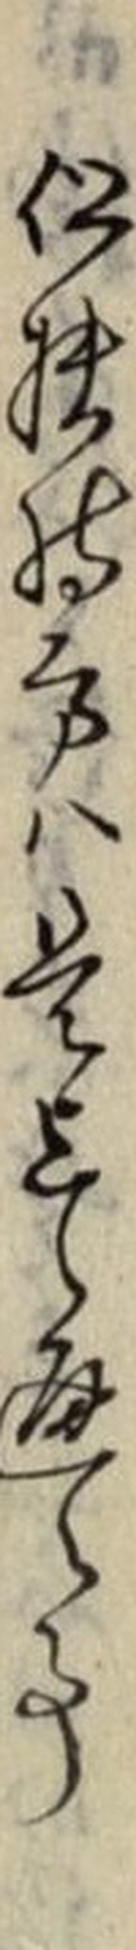但扶持方は是迄之通候事
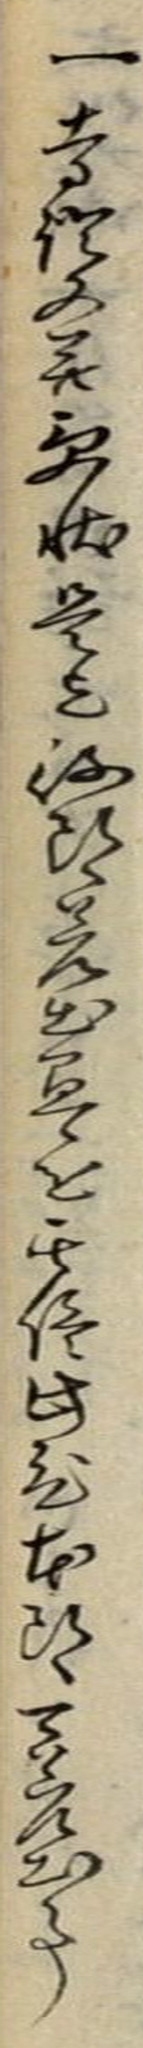一寺証文并受状是迄役頭へ差出置候を其侭此度本頭へ可差出事
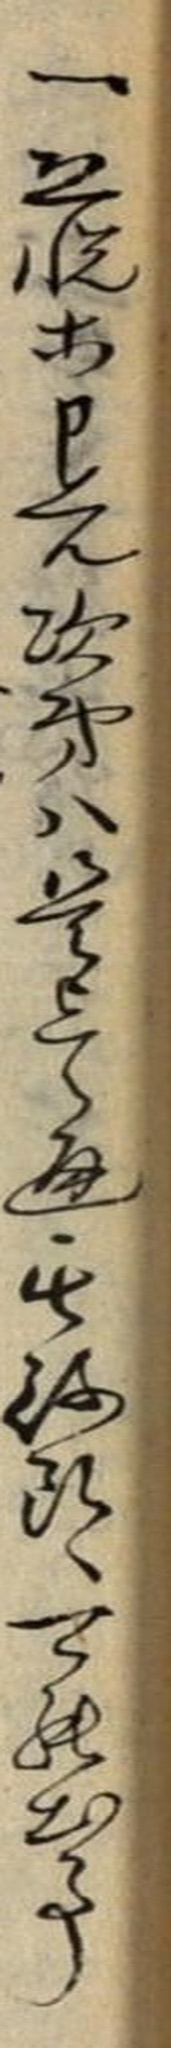一恐悦等申上ル次第は是迄之通其役頭へ可罷出事
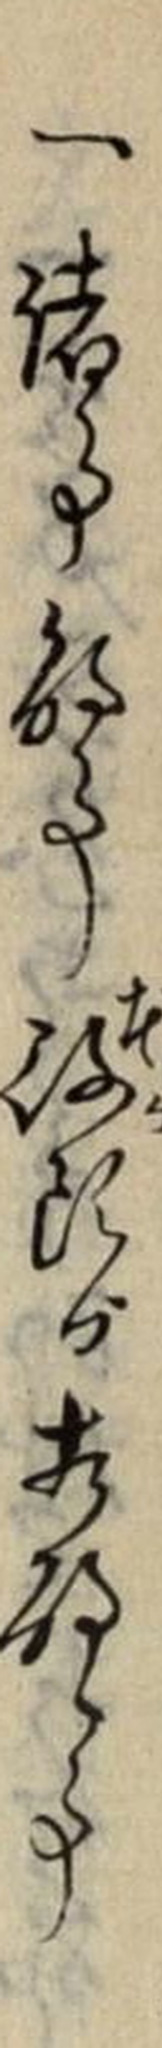一諸事触事本々役頭ゟ相触候事
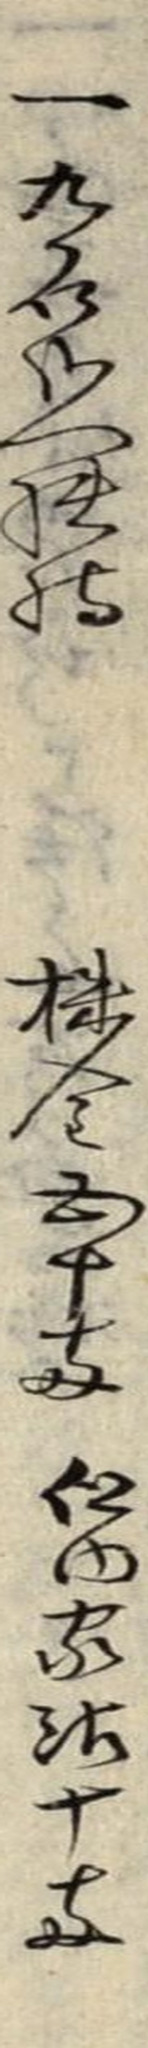一九石弐人扶持株金五十両但内家銀十両
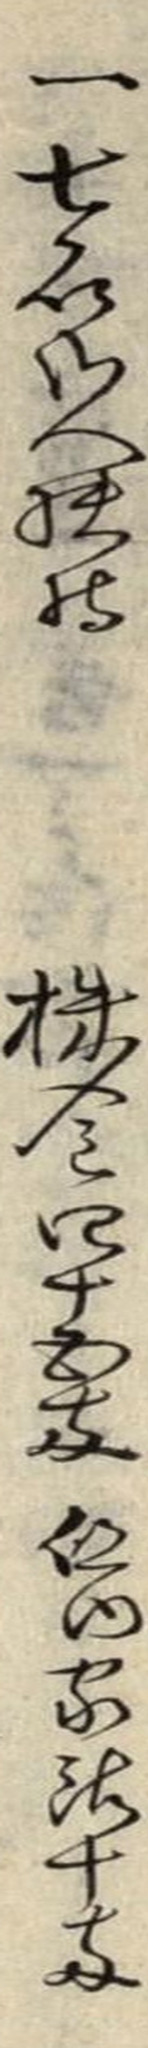一七石弐人扶持株金四十五両但内家銀十両
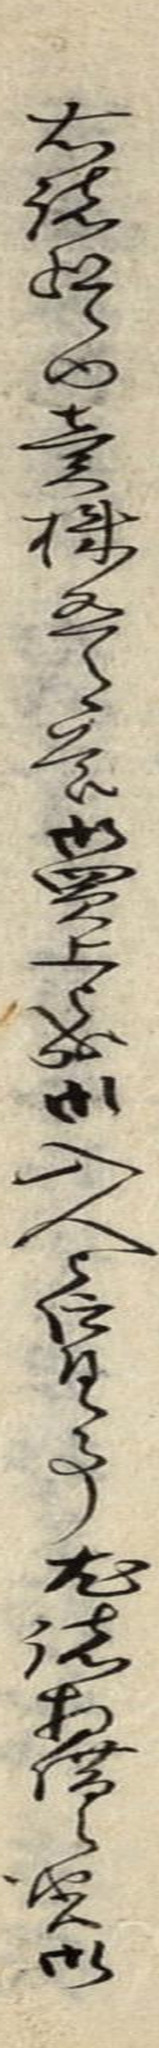右諸組之内売株有之候節御買上被成御入人被仰付候事尤諸拝借之儀は御
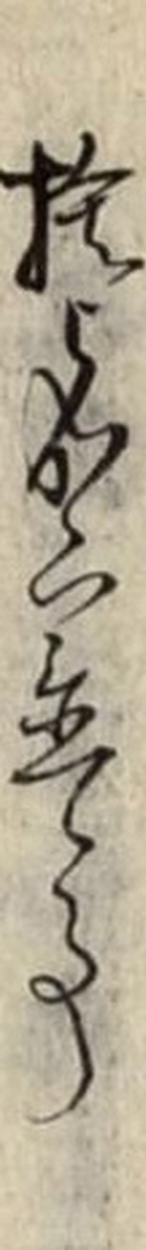捨被成下置候事
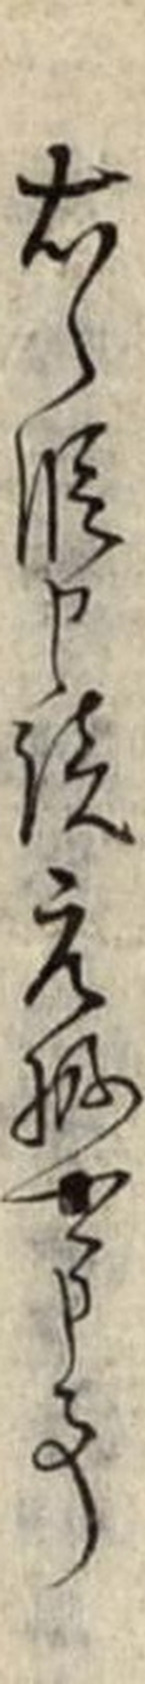右之段申談取扱可申事
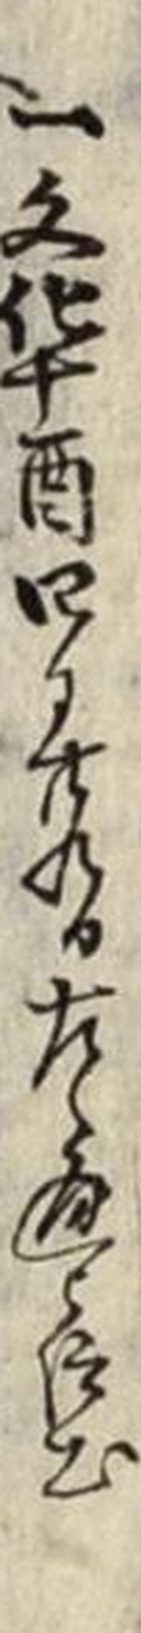一文化十酉四月廿九日左之通被仰出
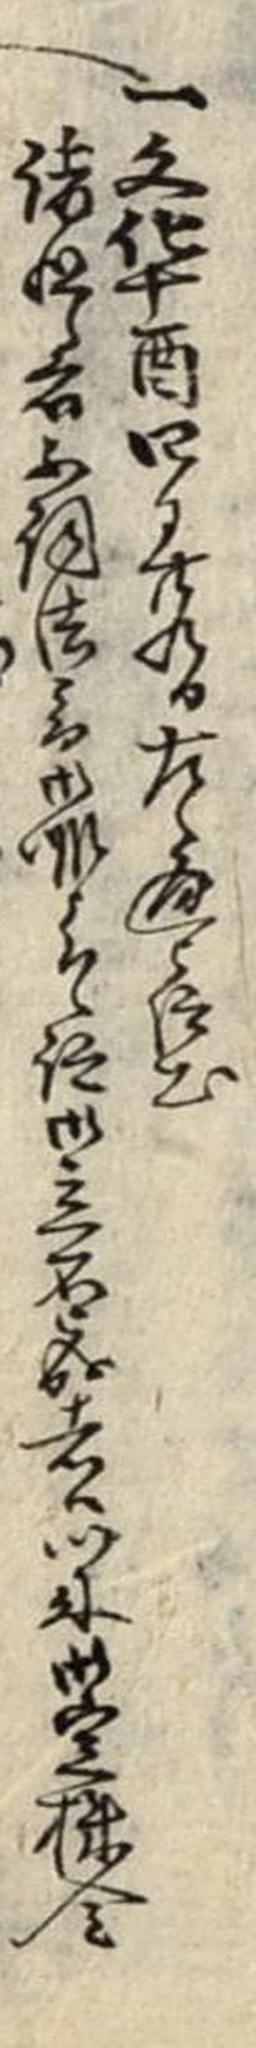諸組之者不調法に而御暇被下候跡御立不被成者は以来御定株金
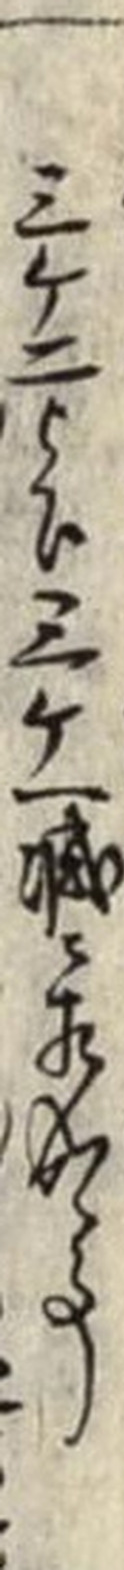三ヶ二被下三ヶ一減に相成候事
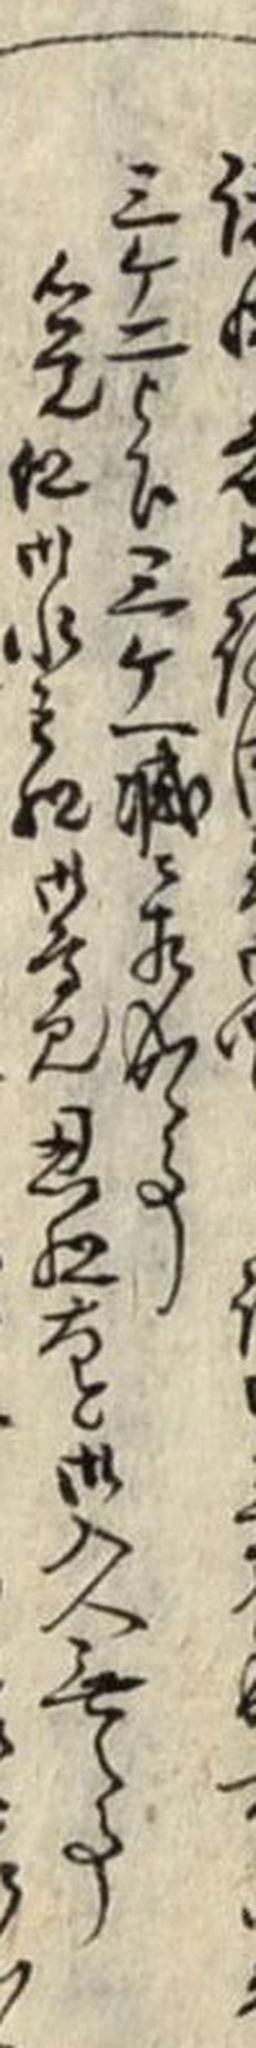心覚但御水主組御鳥見忍組なと御入人無之事
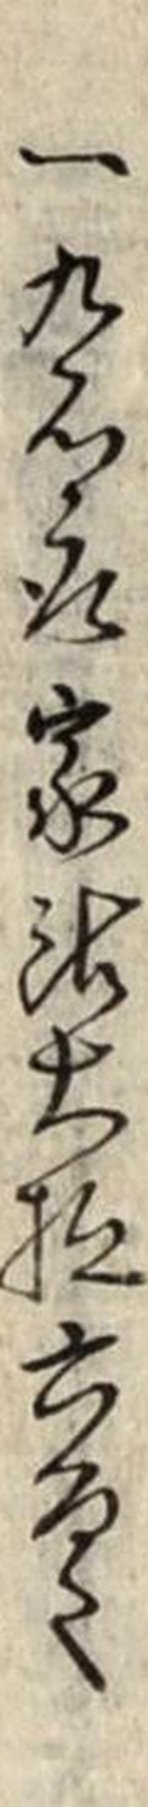一九石取家銀大担？六百匁
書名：御用并被仰出之部
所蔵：福井県文書館 Fukui Prefectural Archives
